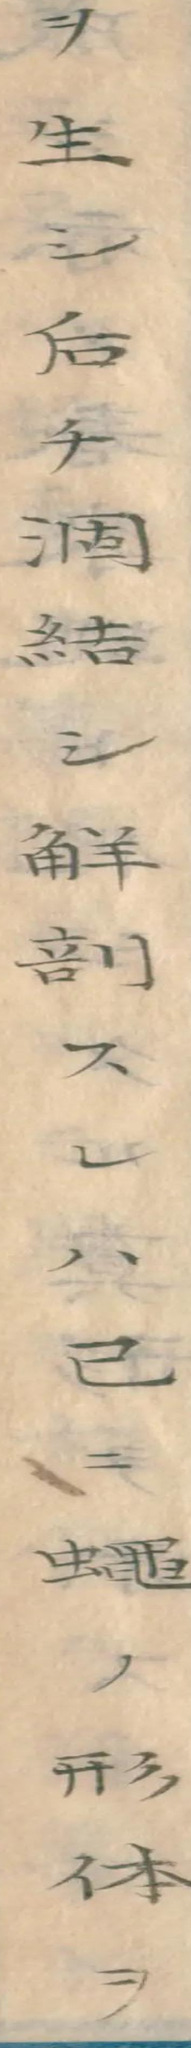ヲ生シ后チ涸結シ解剖スレハ已ニ蝿ノ形体ヲ

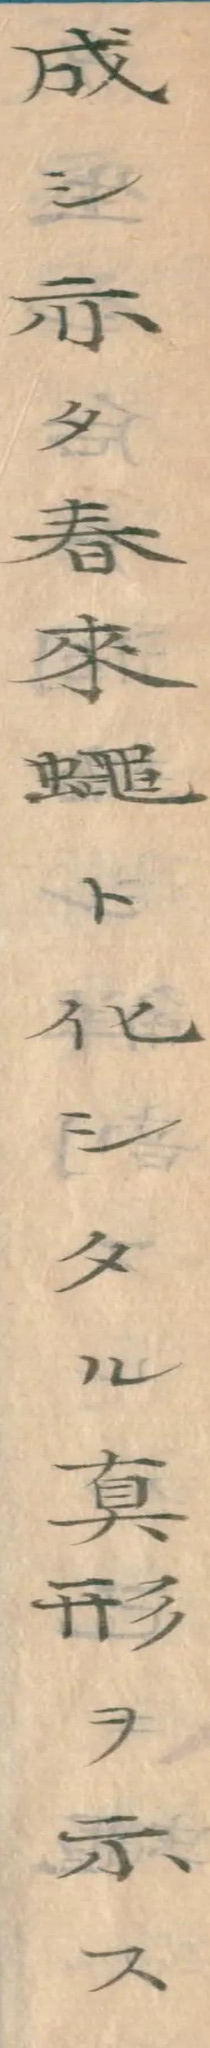成シ亦タ春来蝿ト化シタル真形ヲ示ス
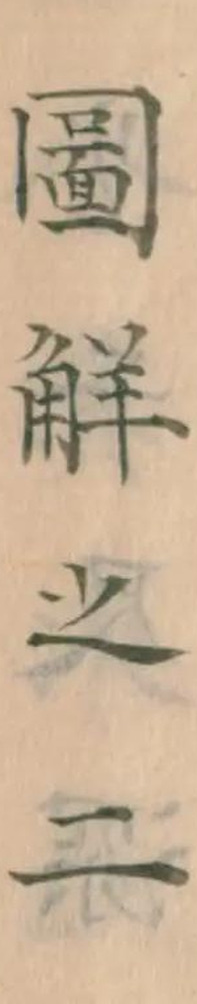図解之二
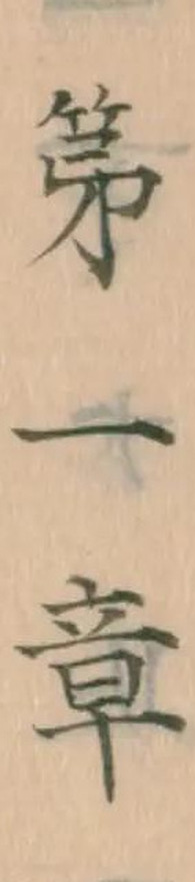第一章
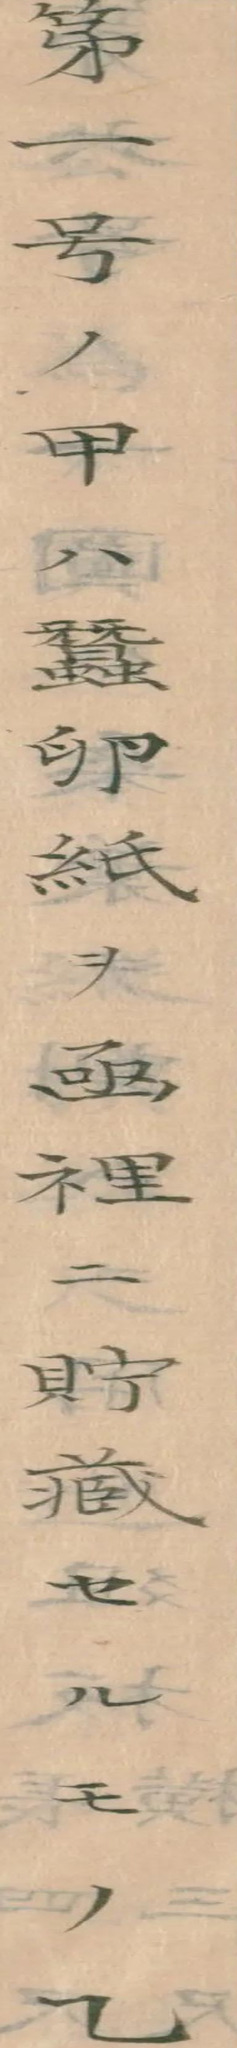第一号ノ甲ハ蚕卵紙ヲ函裡ニ貯蔵セルモノ乙
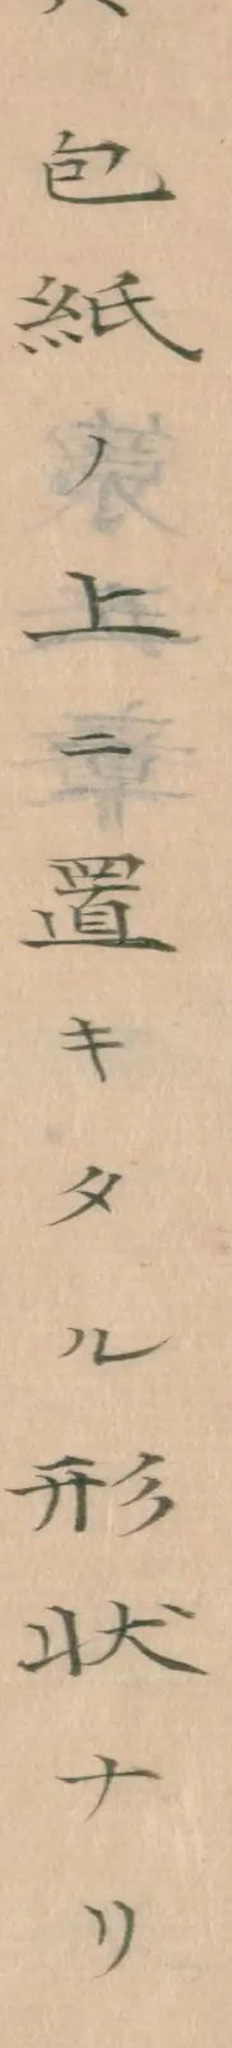ハ包紙ノ上ニ置キタル形状ナリ
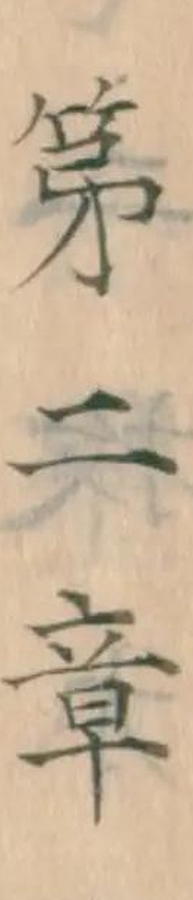第二章
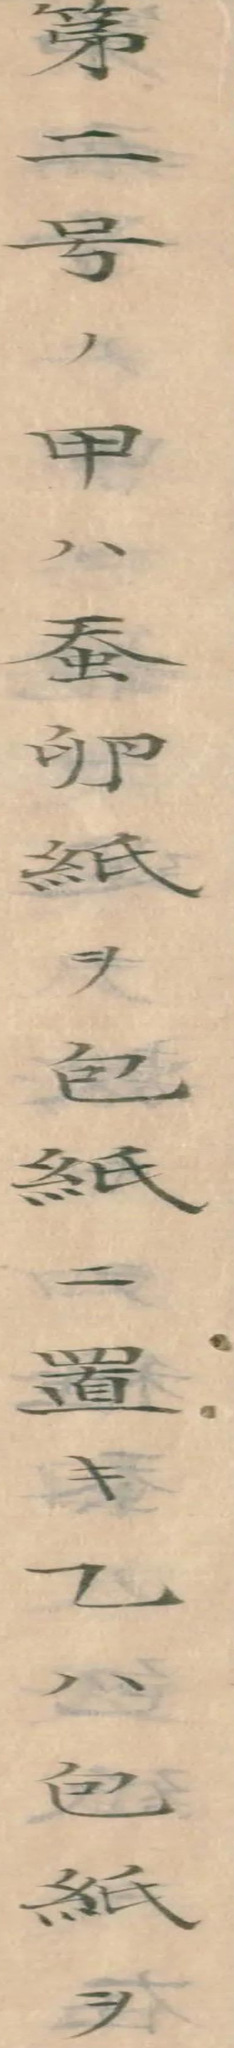第二号ノ甲ハ蚕卵紙ヲ包紙ニ置キ乙ハ包紙ヲ
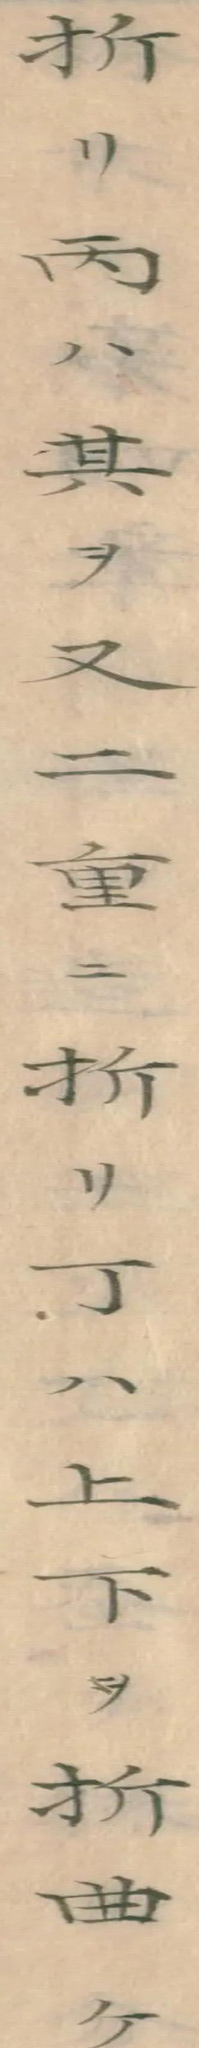折リ丙ハ其ヲ又二重ニ折リ丁ハ上下ヲ折曲ケ
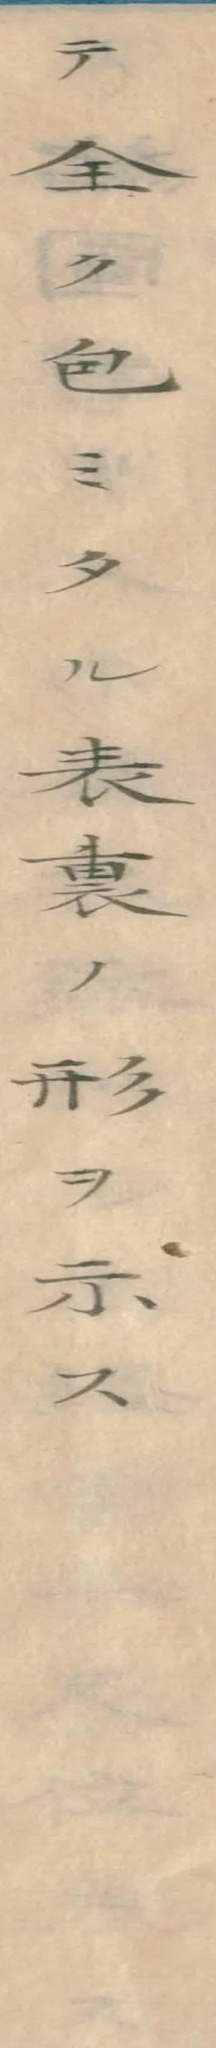テ全ク包ミタル表裏ノ形ヲ示ス
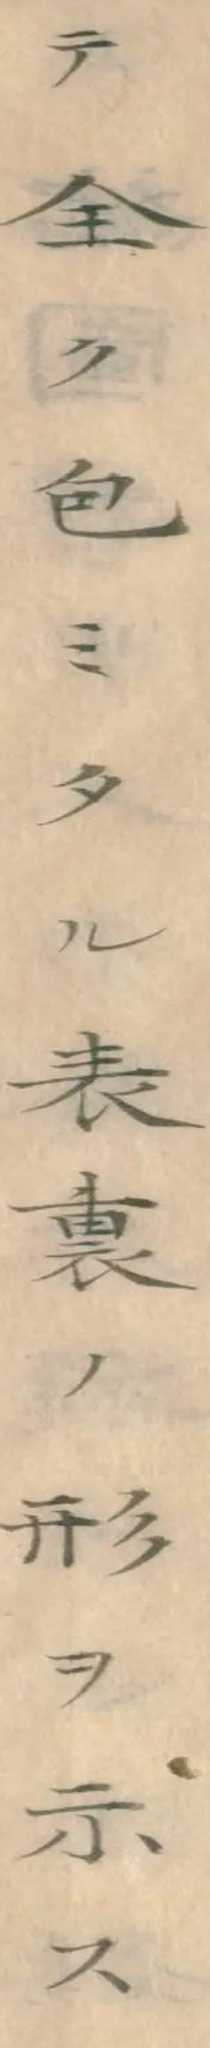テ全ク包ミタル表裏ノ形ヲ示ス
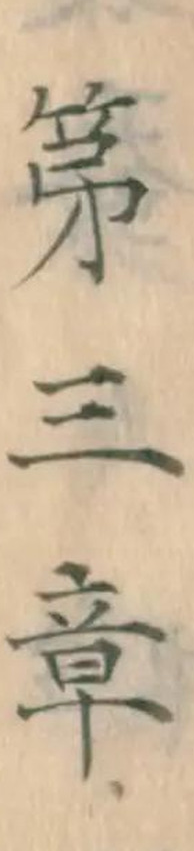第三章
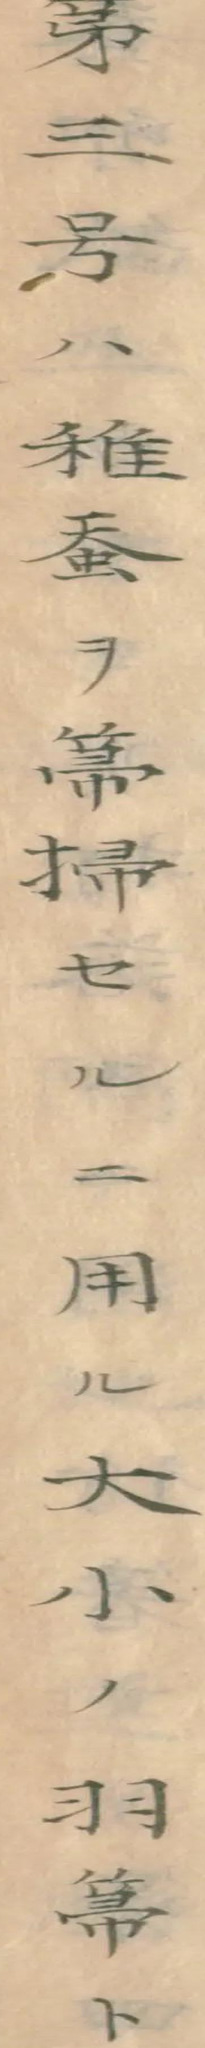第三号ハ稚蚕ヲ箒掃セルニ用ル大小ノ羽箒ト

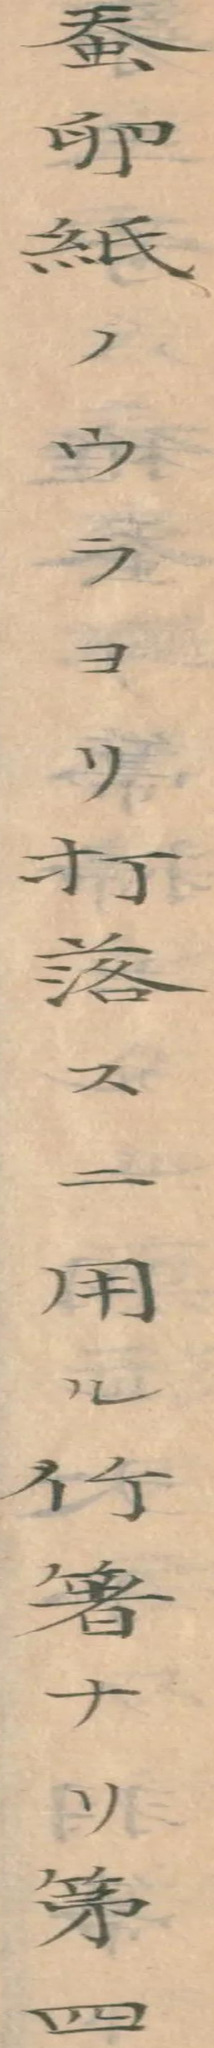蚕卵紙ノウラヨリ打落スニ用ル竹箸ナリ第四
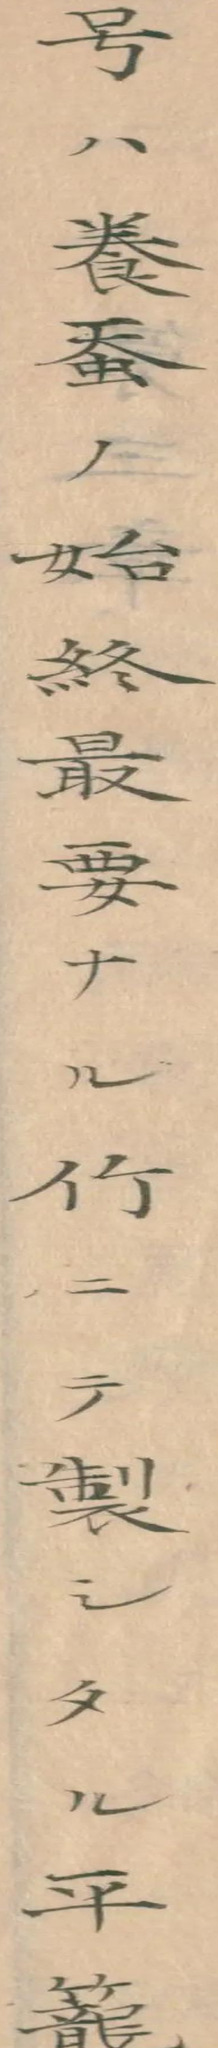号ハ養蚕ノ始終最要ナル竹ニテ製シタル平籠
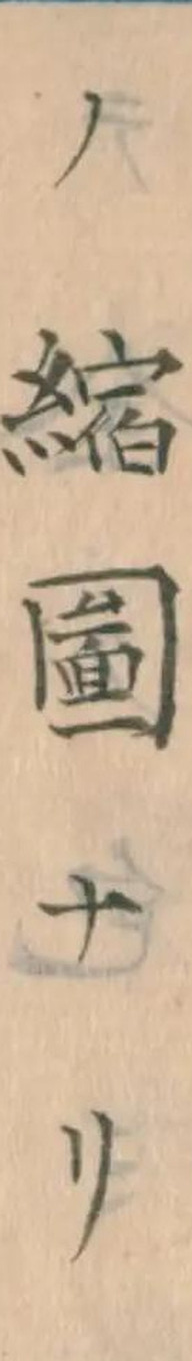ノ縮図ナリ
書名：蚕桑集成
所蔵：国立国会図書館 National Diet Library, JAPAN
